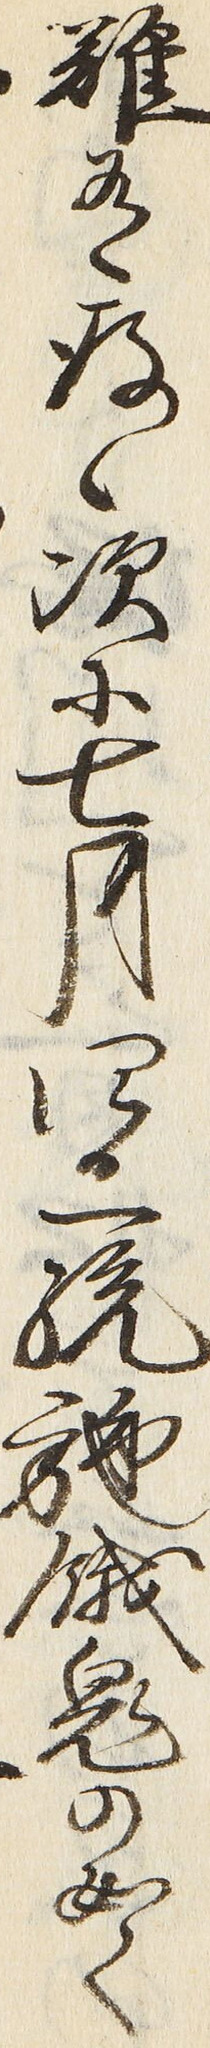難有存候次に七月四日一統施餓鬼の如く
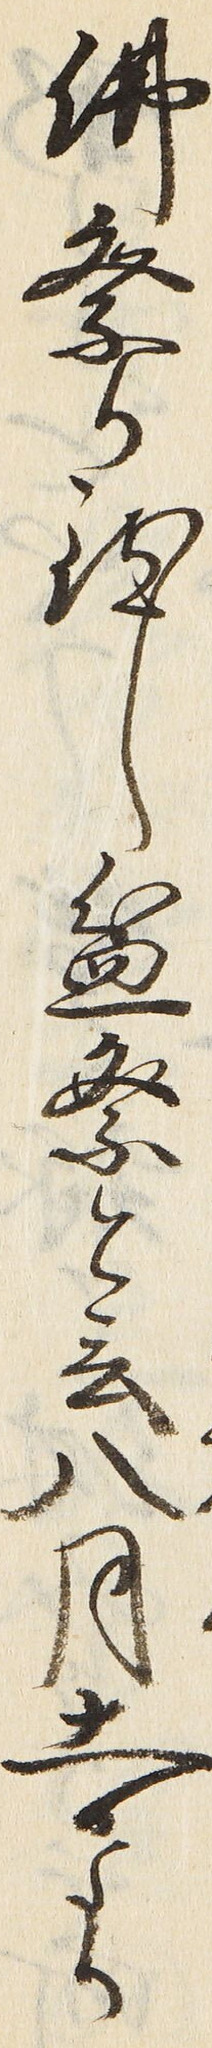仏祭り致し盆祭と云八月十一日より
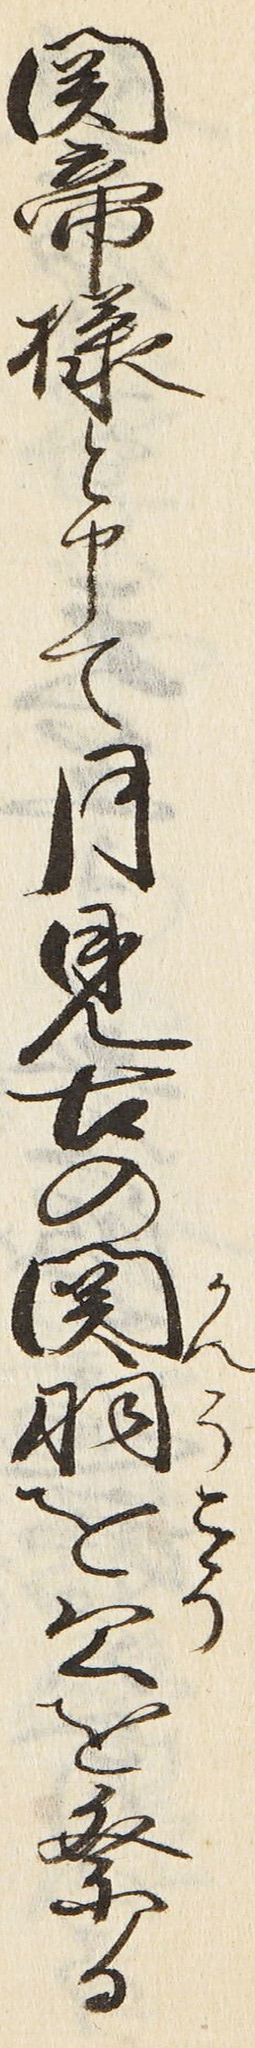関帝様と申て月見古の関羽公を祭る
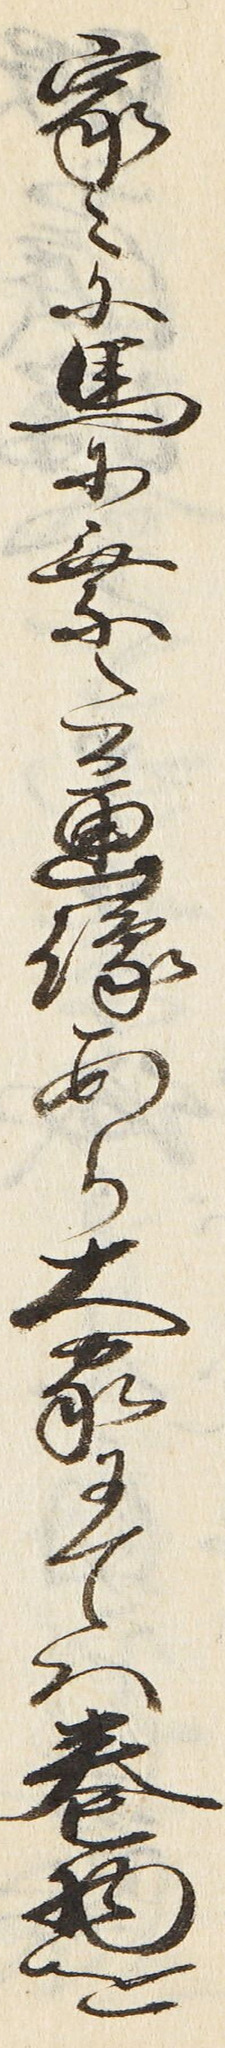家々に馬に乗たる画像あり大家にては巻物を
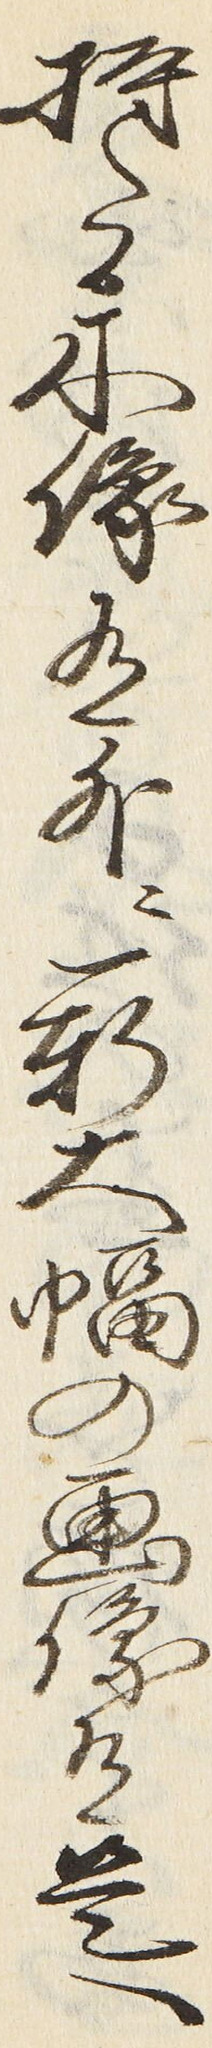持たる木像有外に一軒大幅の画像有是へ
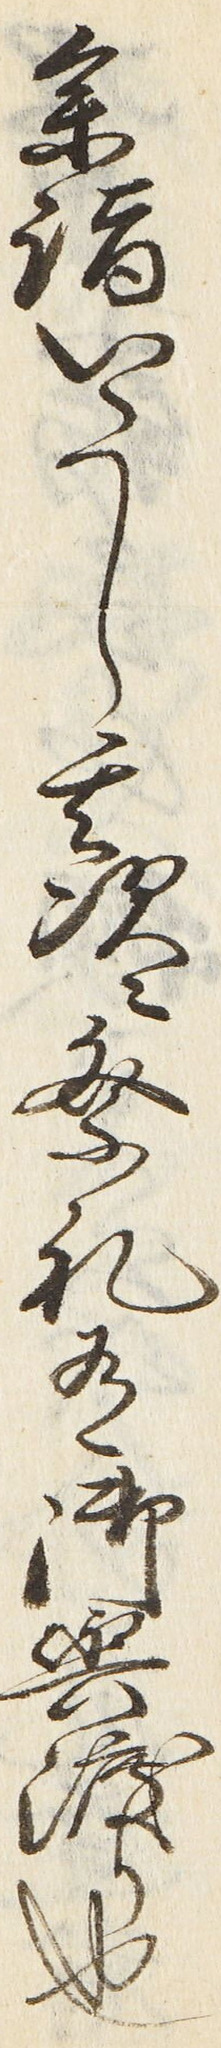参詣いたし其次に祭礼有神輿渡り也
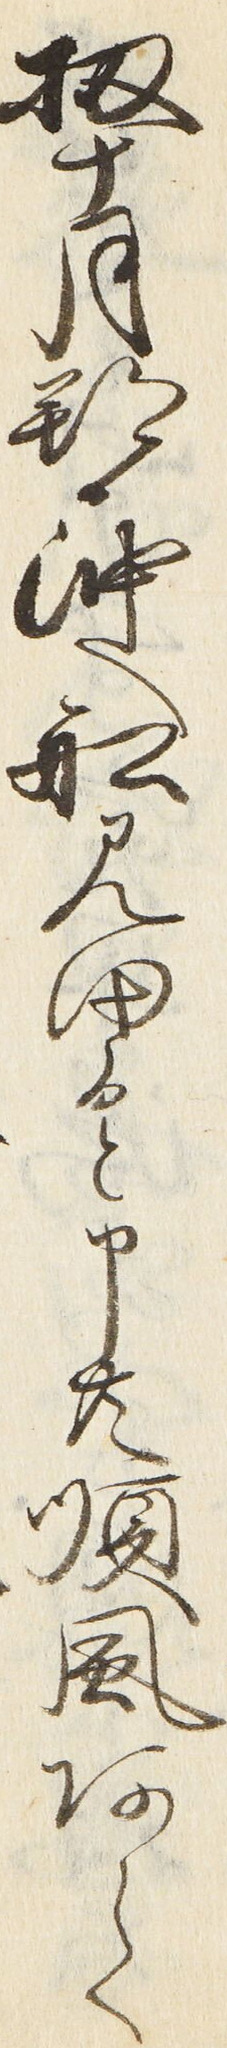扨十月朔日沖へ船見ゆると申共順風あしく
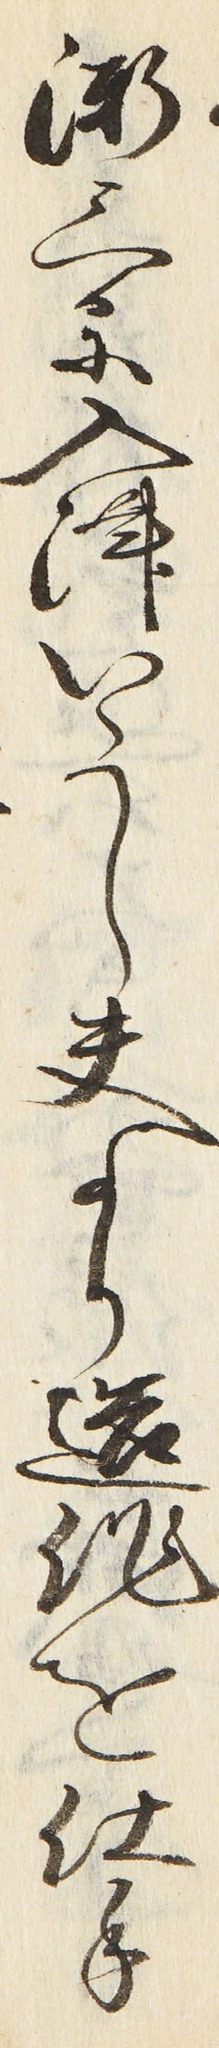漸三日に入津いたし夫より造作を仕手
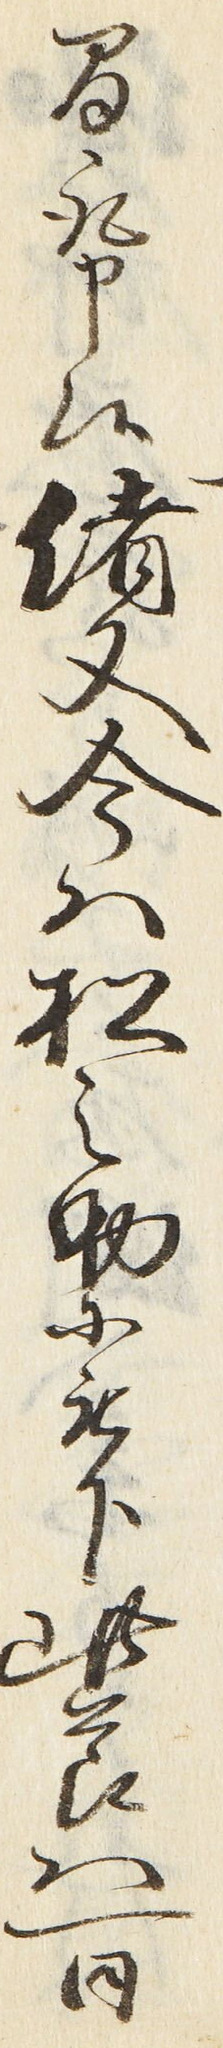間取申候偖又今は松之助に被下此節は一日
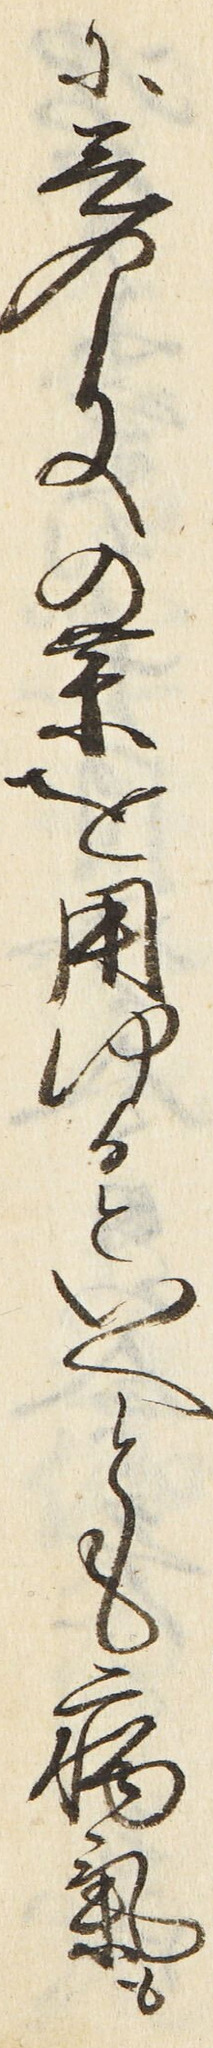に壱文の薬を用ゆるといへともびょ病気も

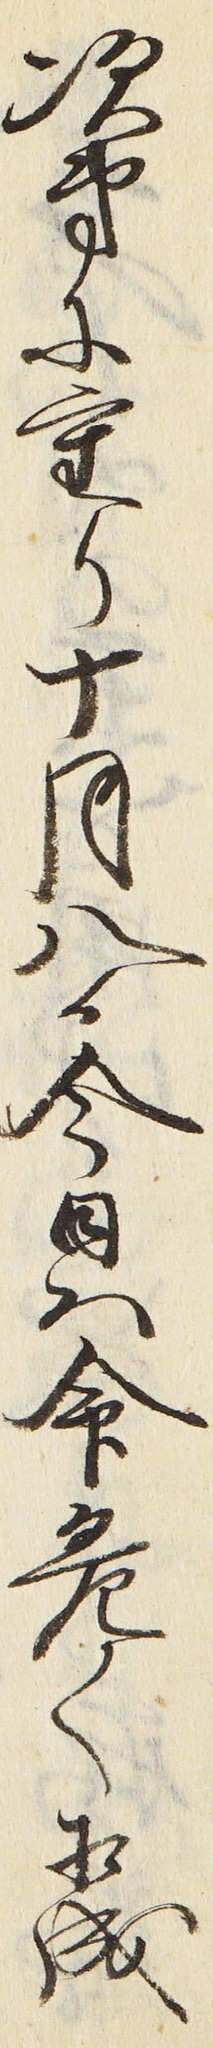次第に重り十月八日今日は命危うく危く相成
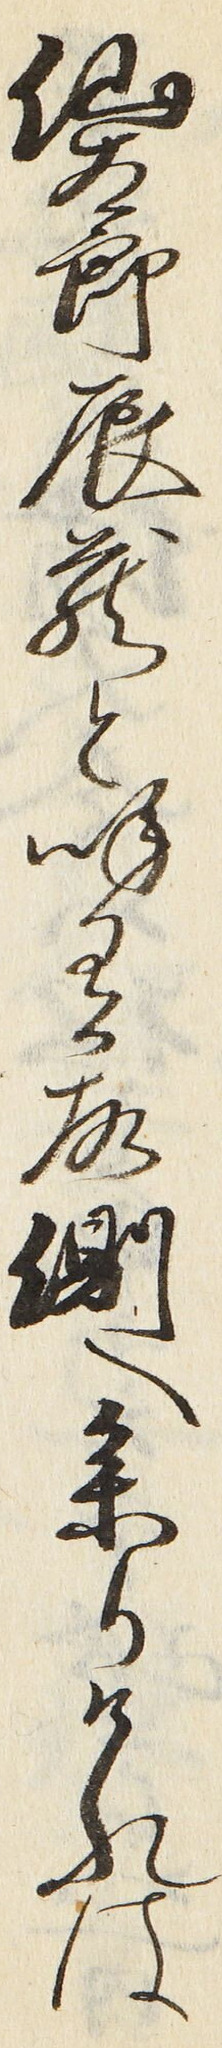仙太郎辰蔵と呼わる故側へ参りけれは
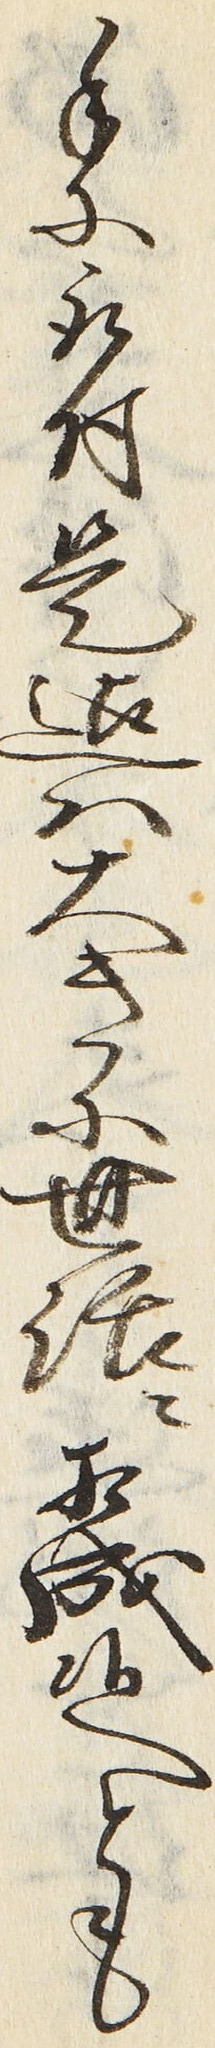手に取付是迄は大きに世話に相成候へへとも
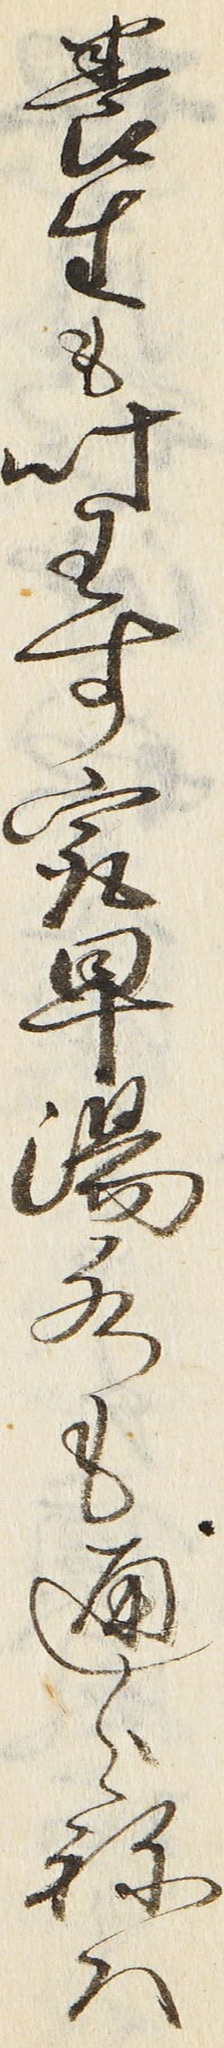養生も叶わす最早湯水も通らねは
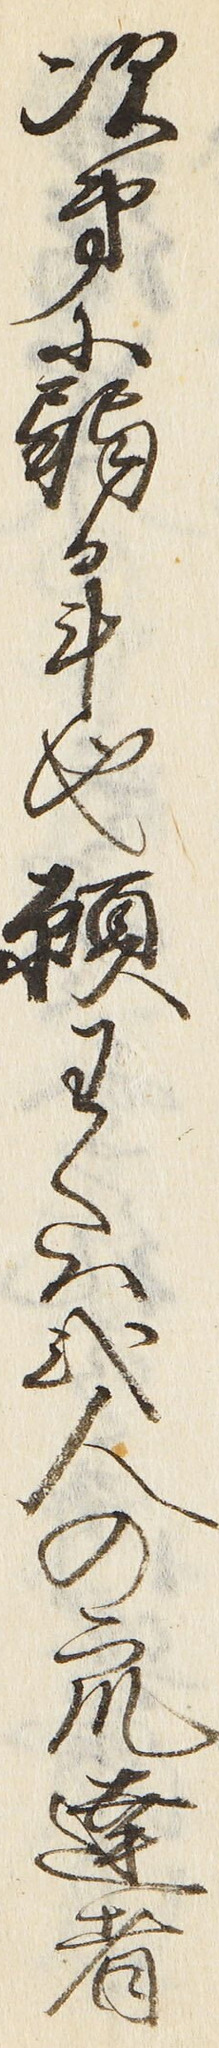次第に弱る計也願わくは弐人の衆達者
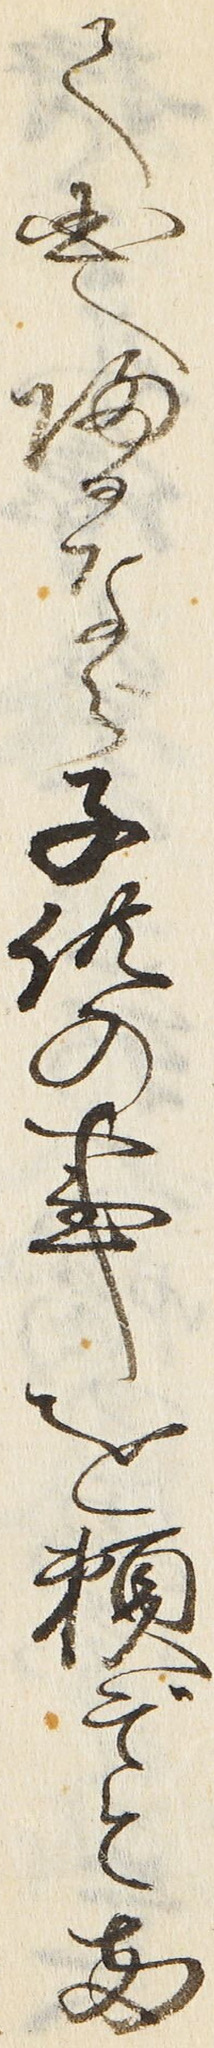て国へ帰るなら子供の事を頼そと両
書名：天保漂流記
